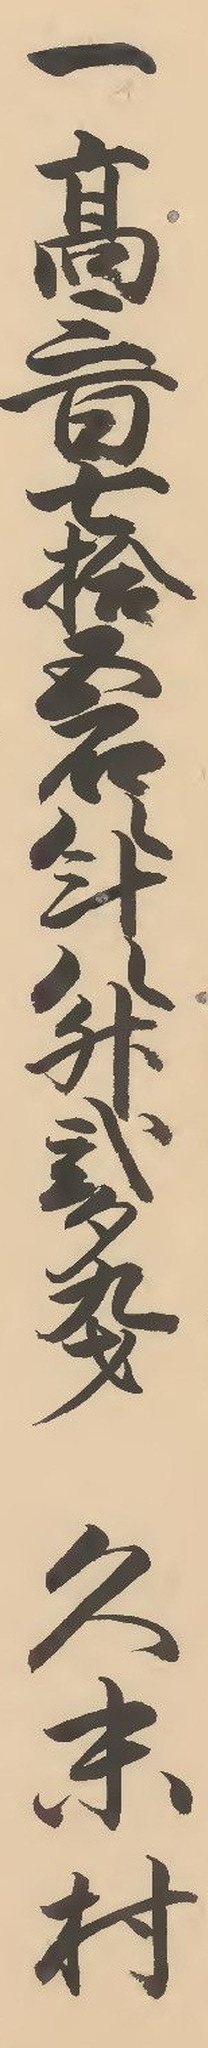一高三百七拾五石八斗八升弐勺九才久末村
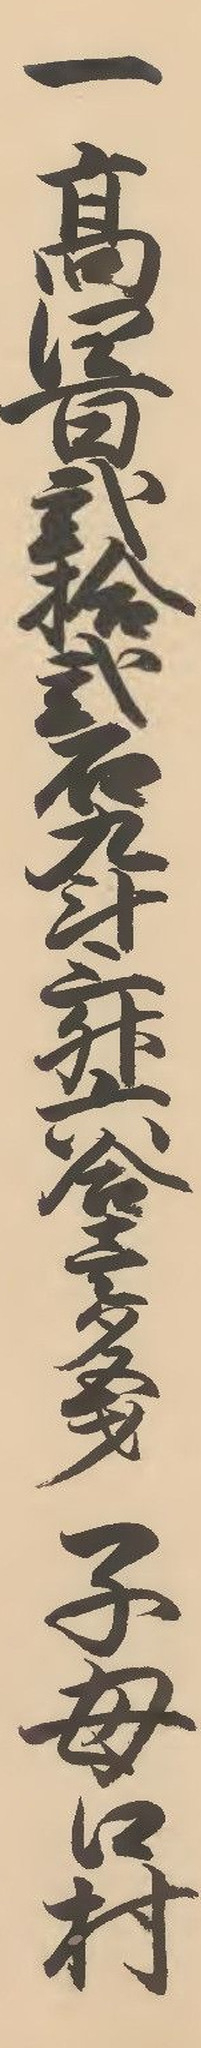一高四百弐拾弐石九斗三升六合壱勺五才子母口村
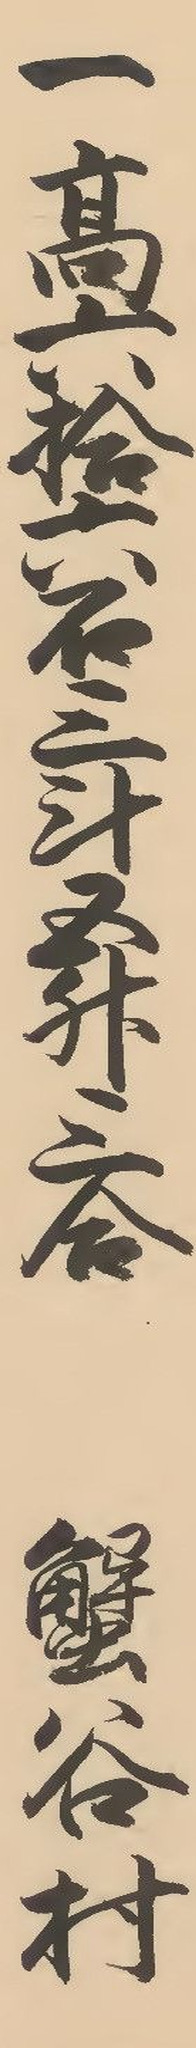一高六拾六石三斗五升三合蟹谷村
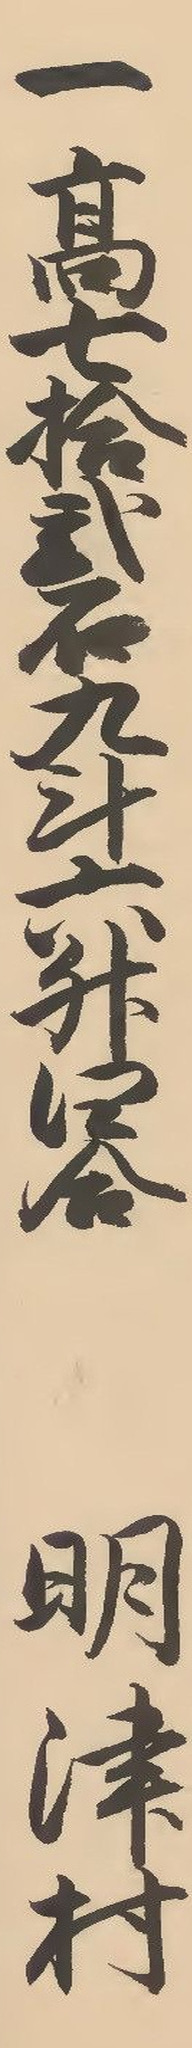一高七拾弐石九斗六升四合明津村
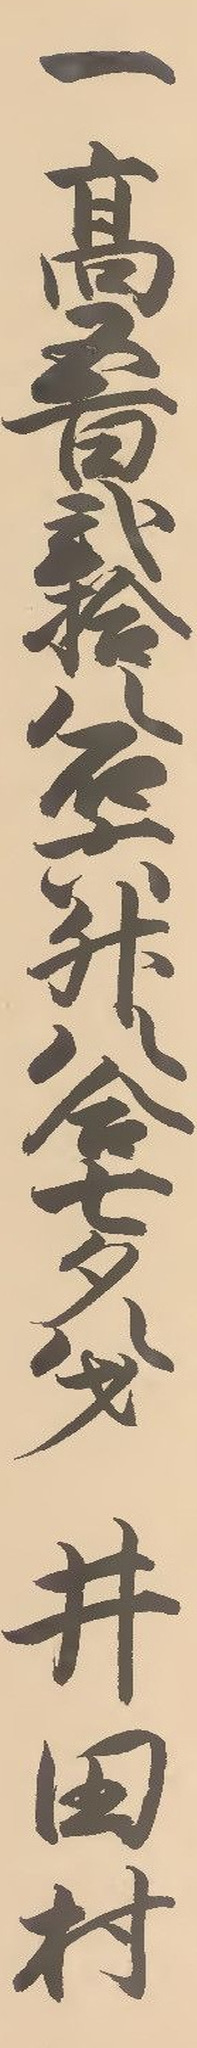一高五百弐拾八石六升八合七勺八才井田村
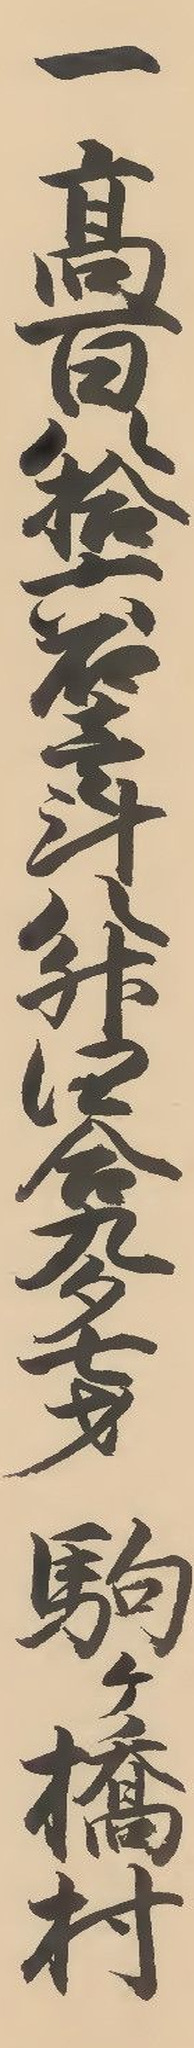一高百八拾六石壱斗八升四合九勺七才駒ヶ橋村
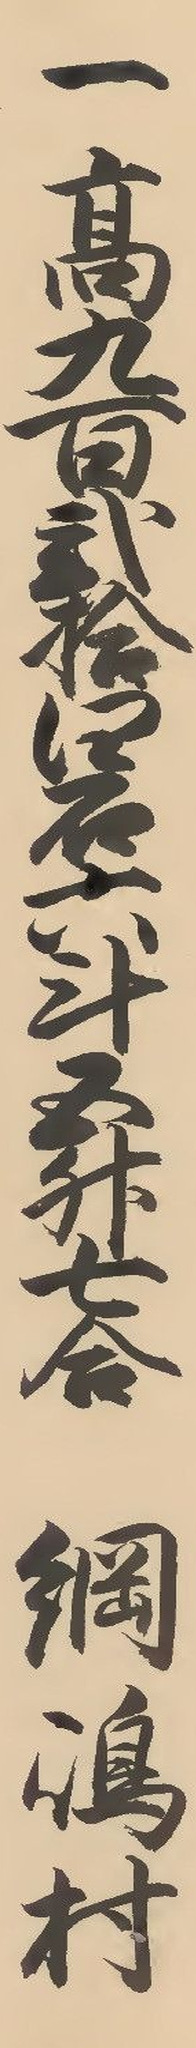一高九百弐拾四石六斗五升七合網嶋村
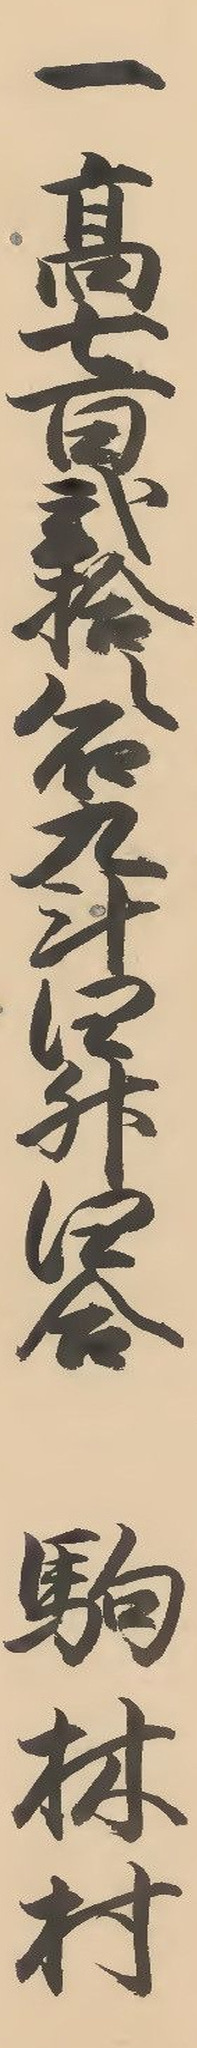一高七百弐拾八石九斗四升四合駒林村

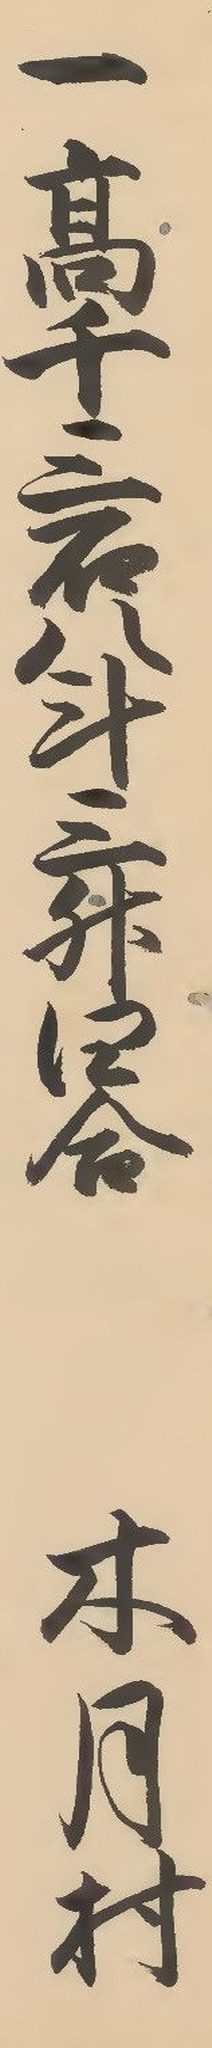一高千三石八斗三升四合木月村
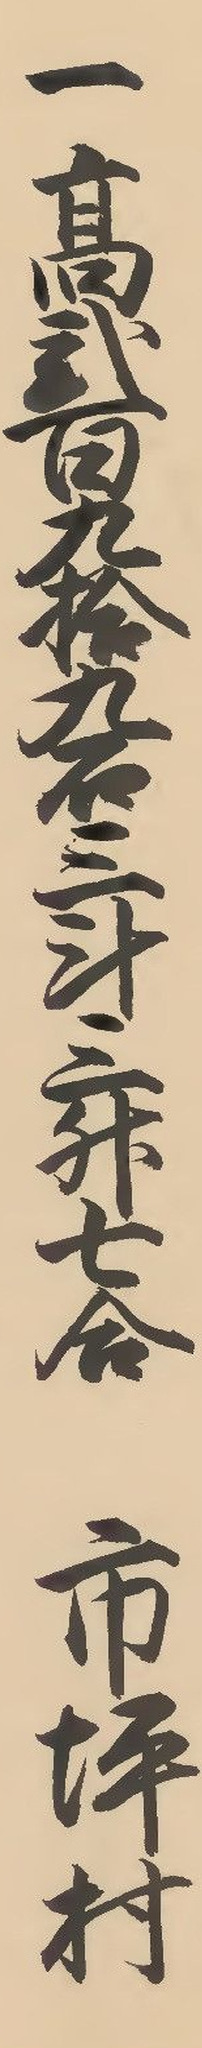一高弐百九拾九石三斗三升七合市坪村
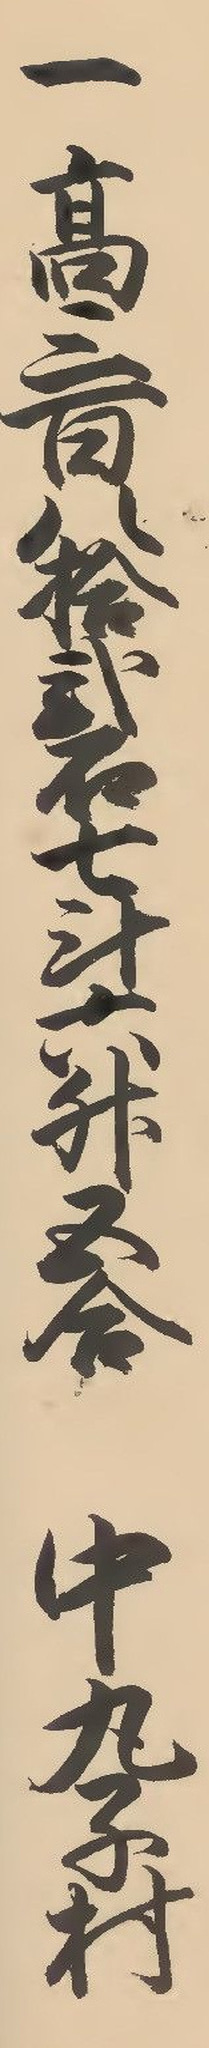一高三百八拾弐石七斗六升五合中丸子村
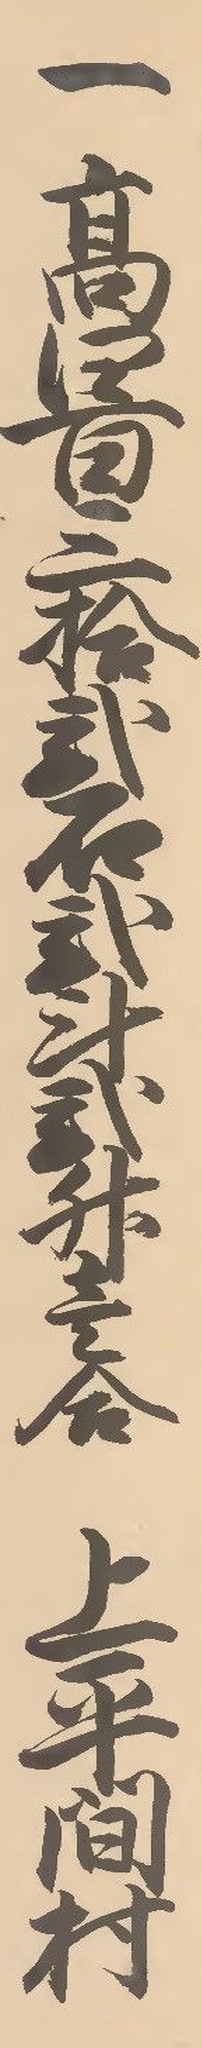一高四百三拾弐石弐斗弐升壱合上平間村
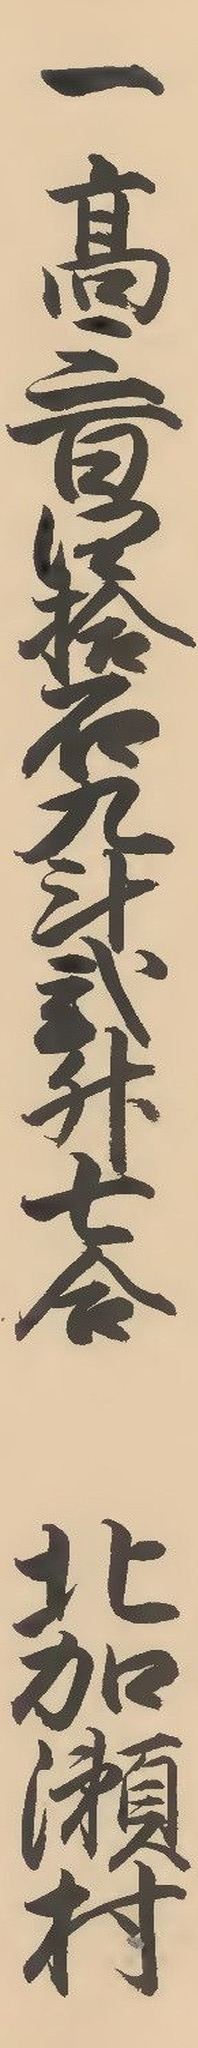一高三百四拾石九斗弐升七合北加瀬村
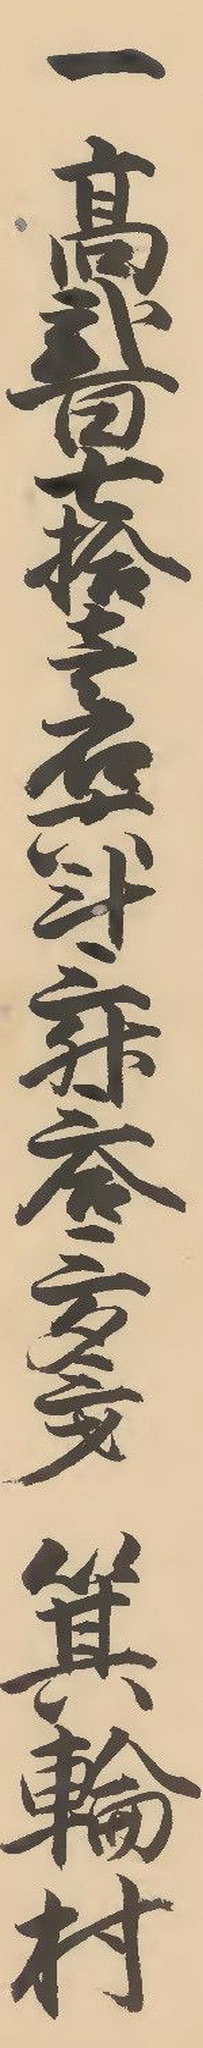一高弐百七拾壱石六斗三升三合三勺三才箕輪村

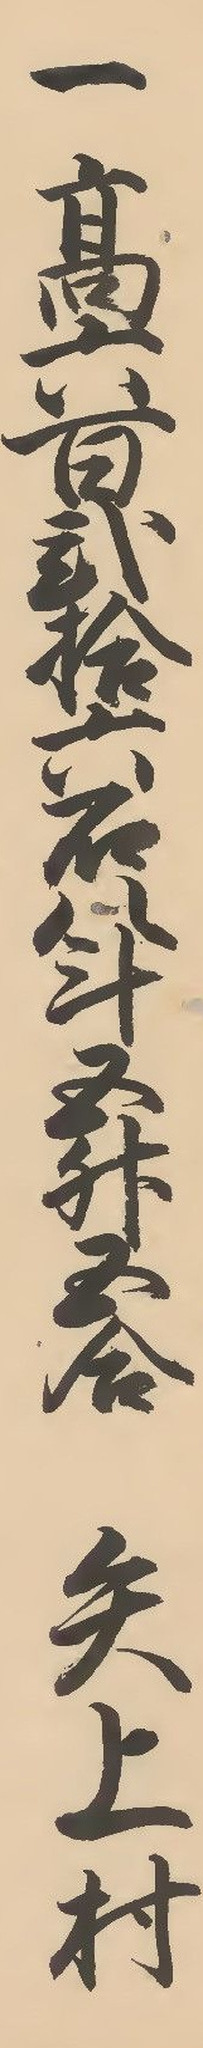一高六百弐拾六石八斗五升五合矢上村
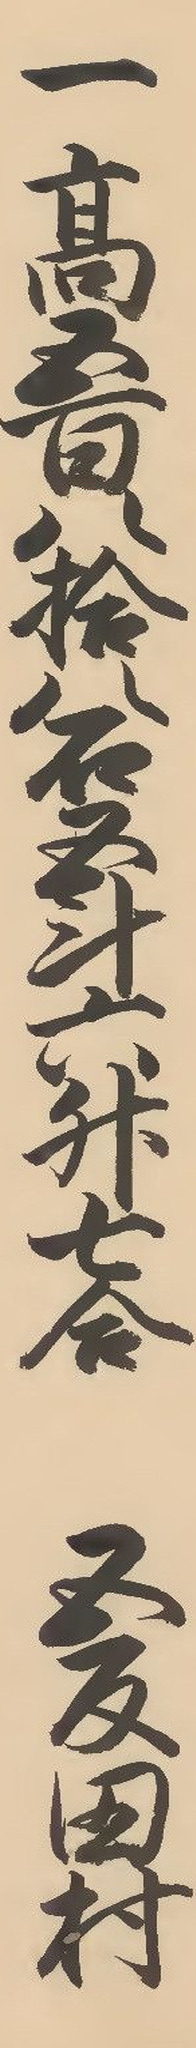一高五百八拾八石五斗六升七合五反田村
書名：武蔵国郷帳　上
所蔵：国立公文書館 National Archives of Japan
